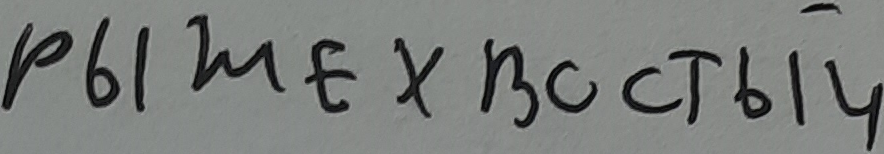рыжехвостый
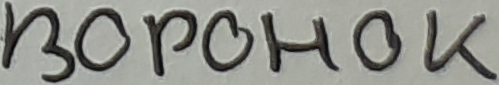воронок
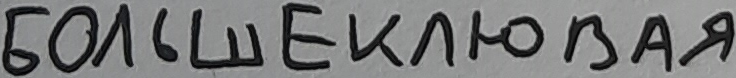большеклювая
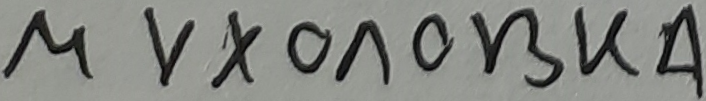мухоловка
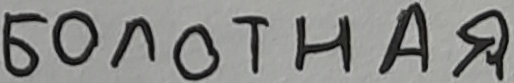болотная
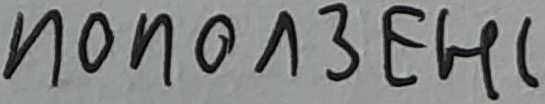поползень
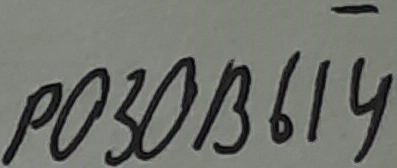розовый
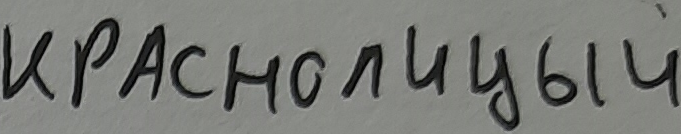краснолицый
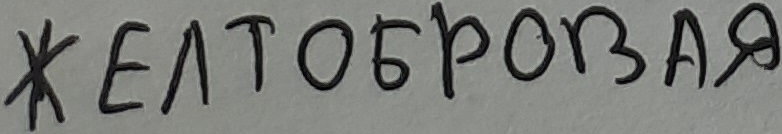желтобровая
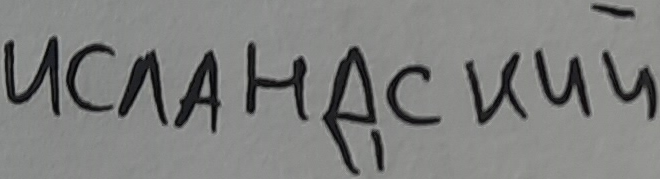исландский
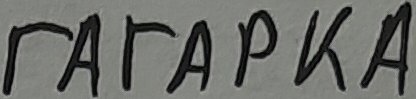гагарка
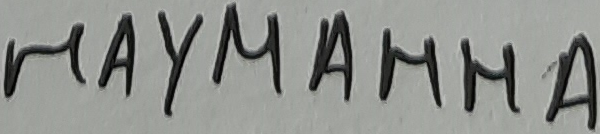науманна
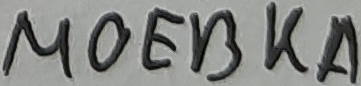моевка
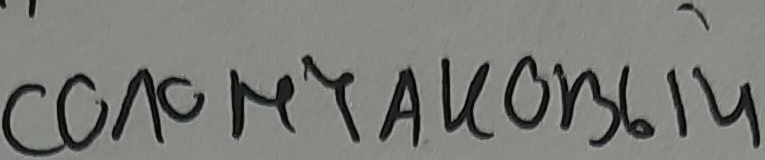солончаковый
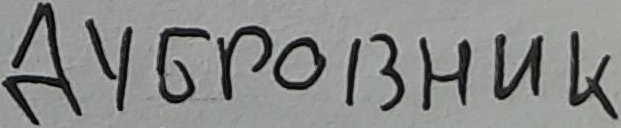дубровник
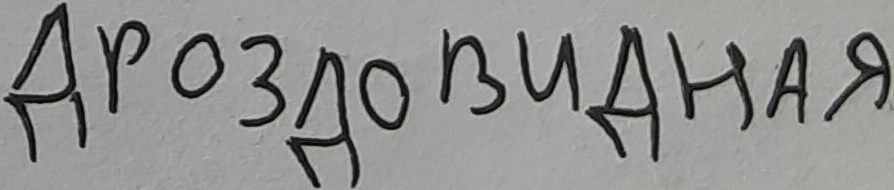дроздовидная
